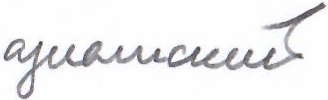азиатский
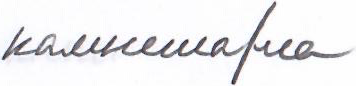камнешарка
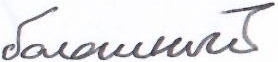болотный
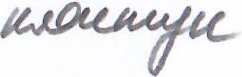клоктун
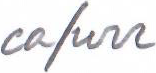сарыч
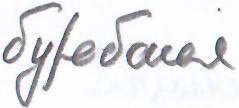буробокая
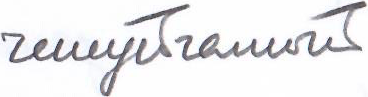чешуйчатый
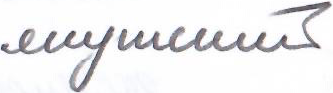якутский
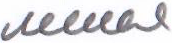лесная
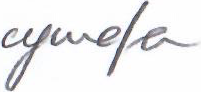сутора
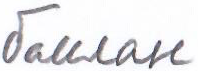баклан
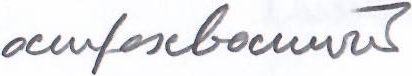острохвостый
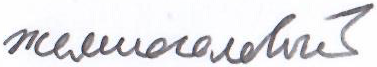желтоголовый
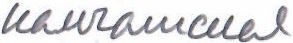камчатская
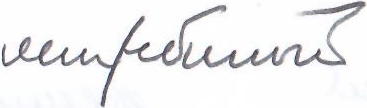ястребиный
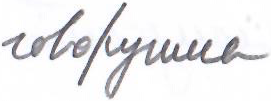говорушка
